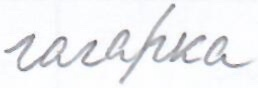гагарка
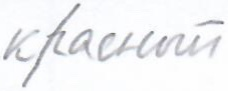красный
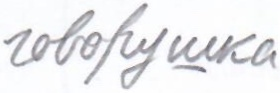говорушка
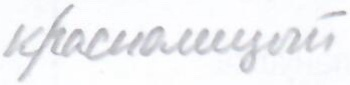краснолицый
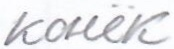конёк
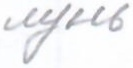лунь
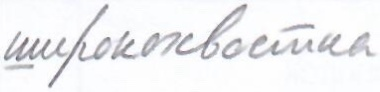широкохвостка
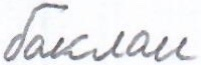баклан
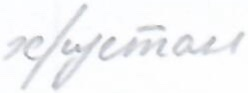хрустан
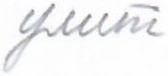улит
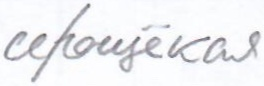серощёкая
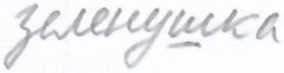зеленушка
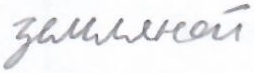земляной
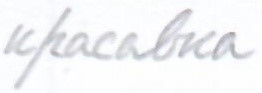красавка
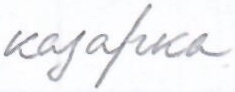казарка
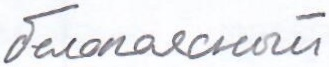белопоясный
